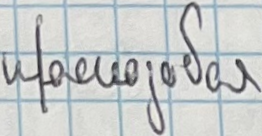краснозобая
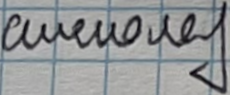стенолаз
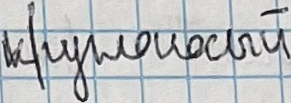круглоносый
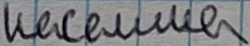касатка
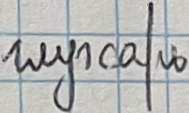глухарь
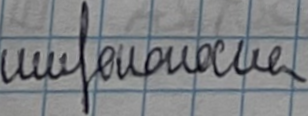широконоска
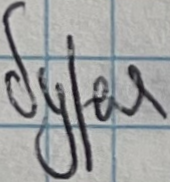бурая
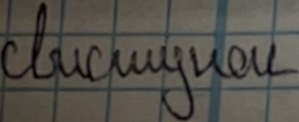свистунок
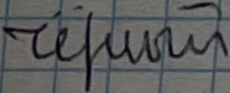чёрный
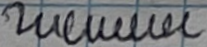чистик
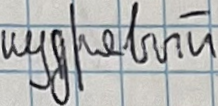кудрявый
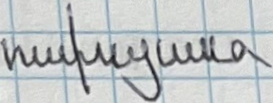тиркушка
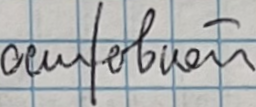островной
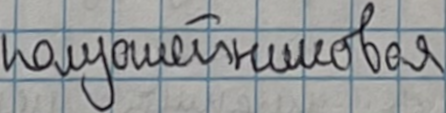полуошейниковая
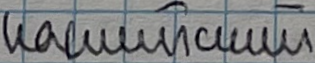каспийский
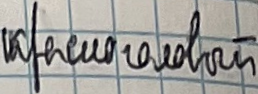красноголовый
